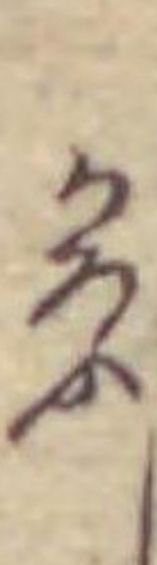かろふ
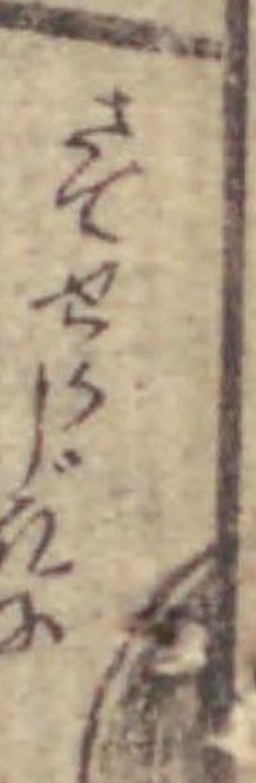さてせうじきに
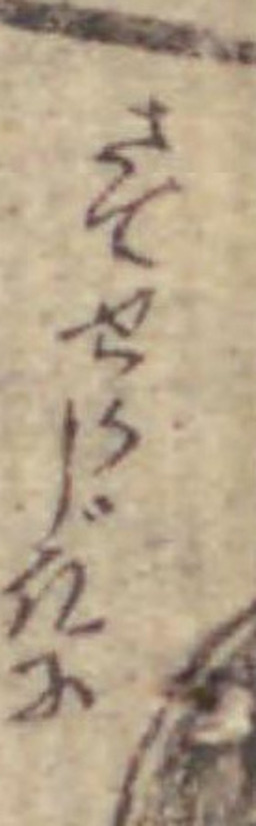さてせうじきに
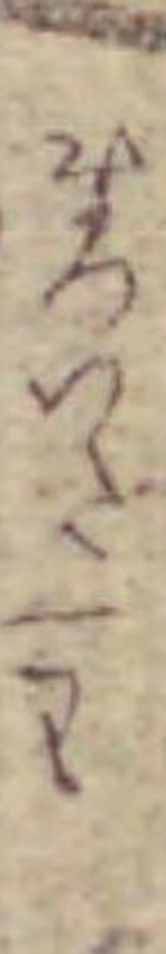生ついた一里
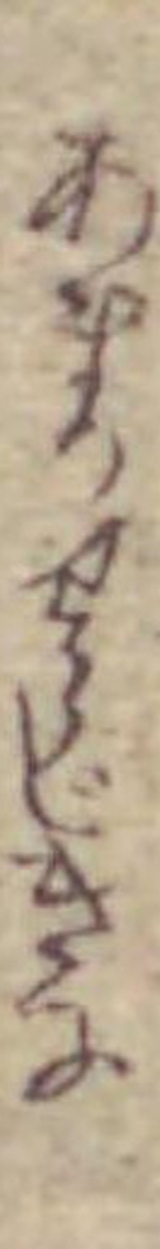あまりせうじきな
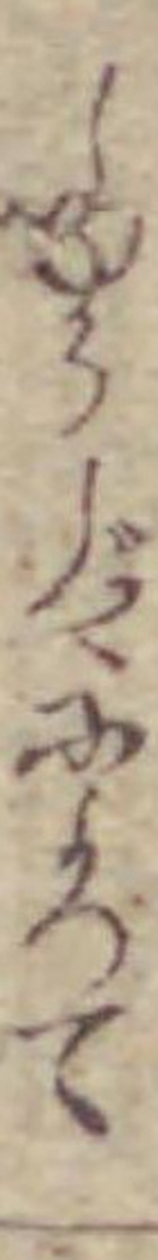しやうじてによつて
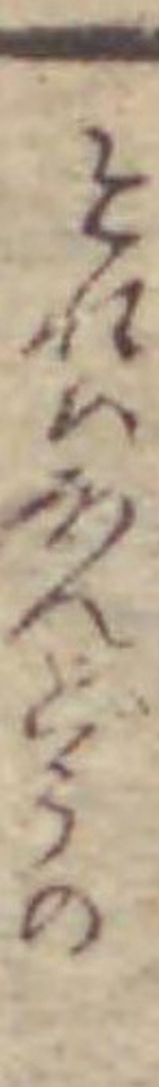それはほんどうの
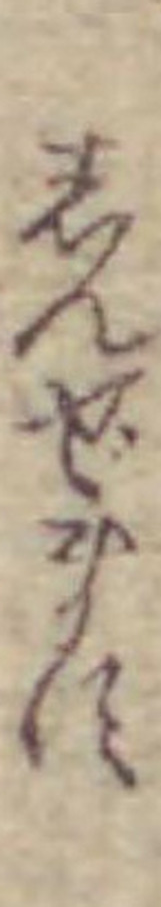しんぜます
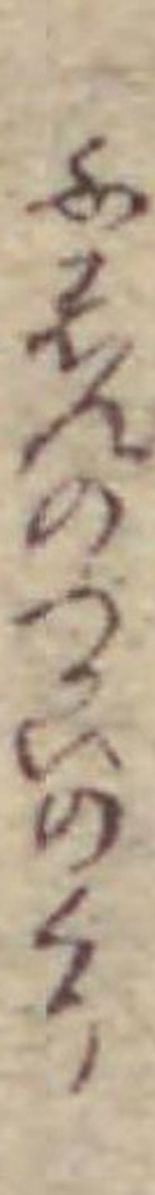ふしんのつかいのくり
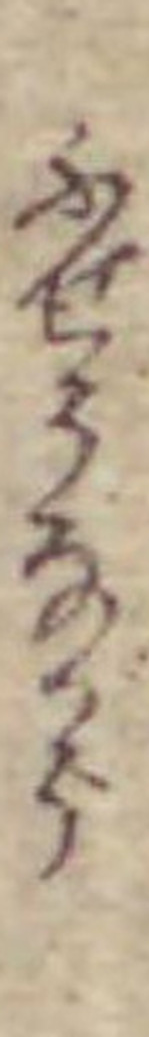ふせうながら
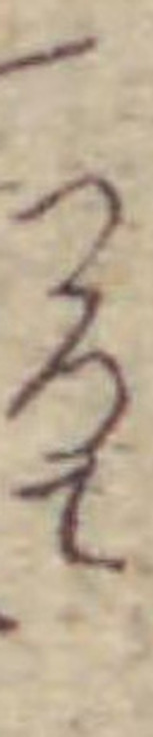つくつて
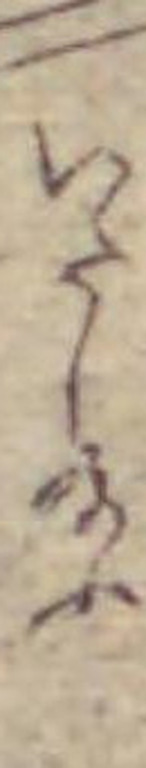いたし候ふ
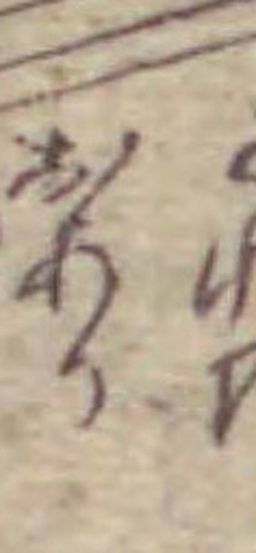おあり
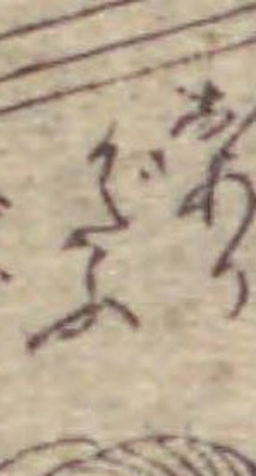がたふ
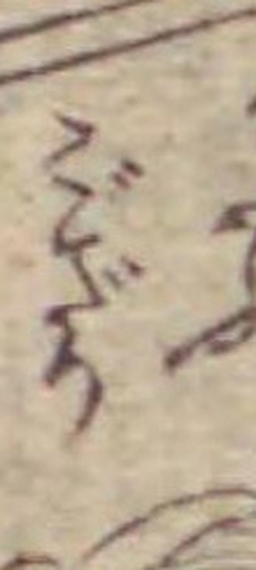ござり
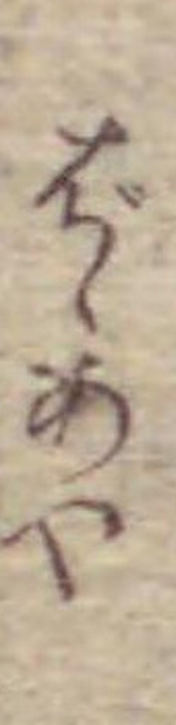ばゝあや
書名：交古勢昔咄 : 2巻
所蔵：国立国会図書館 National Diet Library, JAPAN
